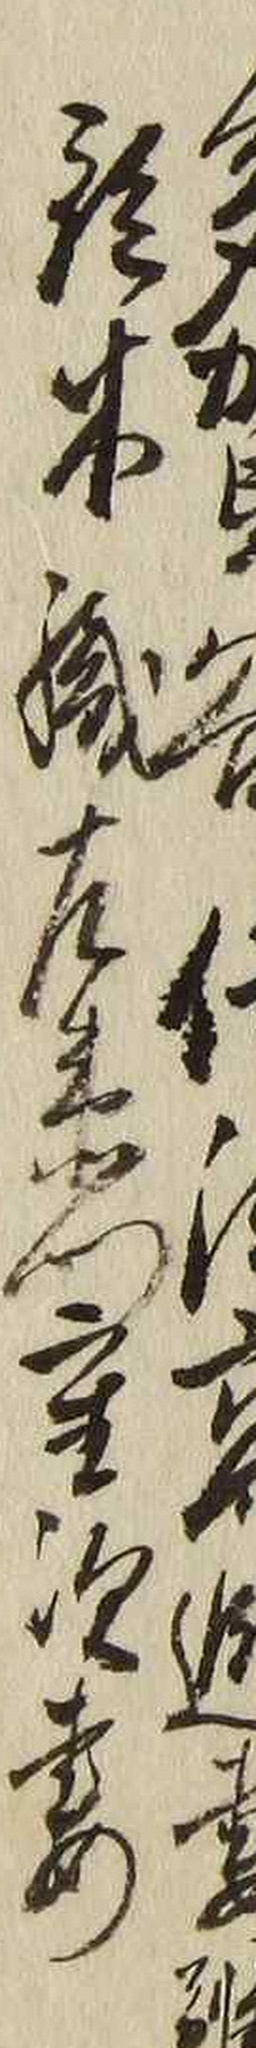鈴木織左衛門重次妻
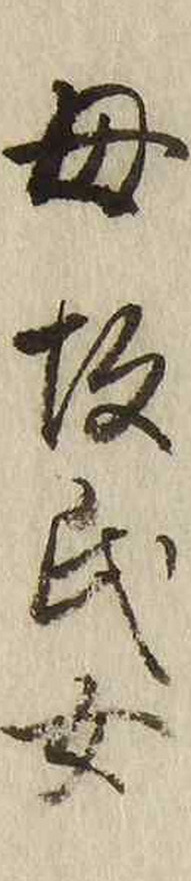母坂氏女

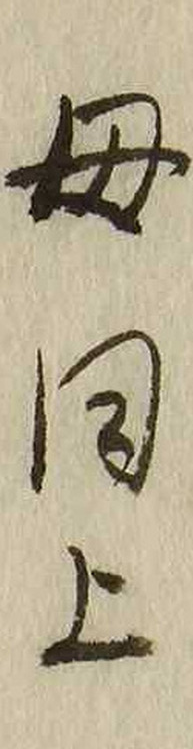母同上
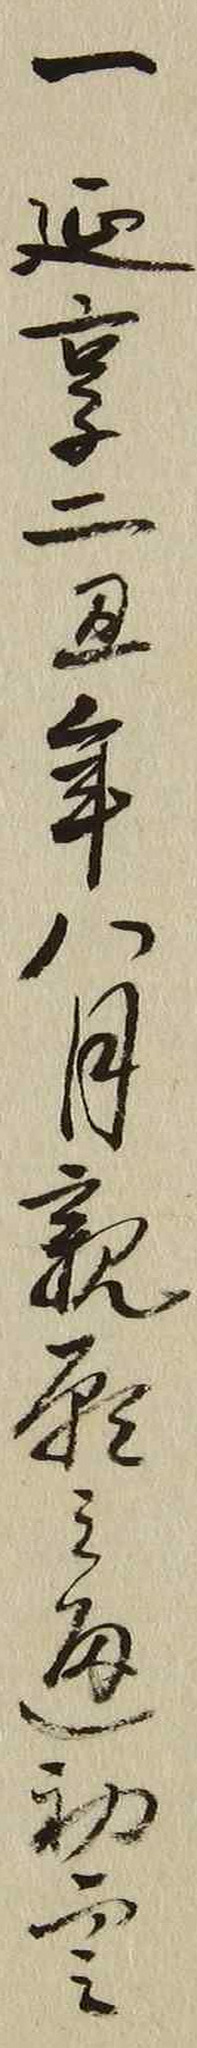一延享二丑年八月親願之通初而之
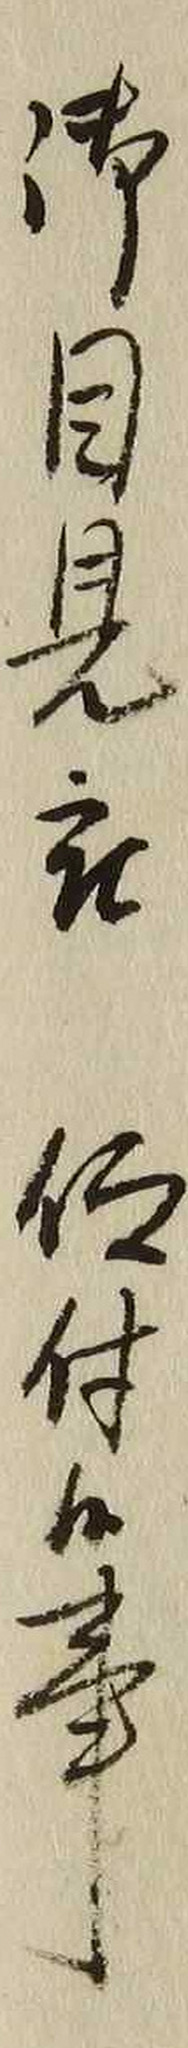御目見被仰付候事
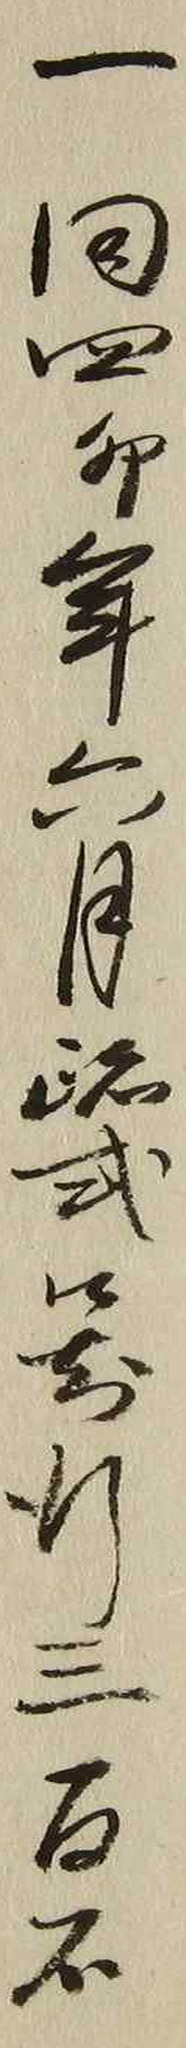一同四卯年六月跡式御知行三百石
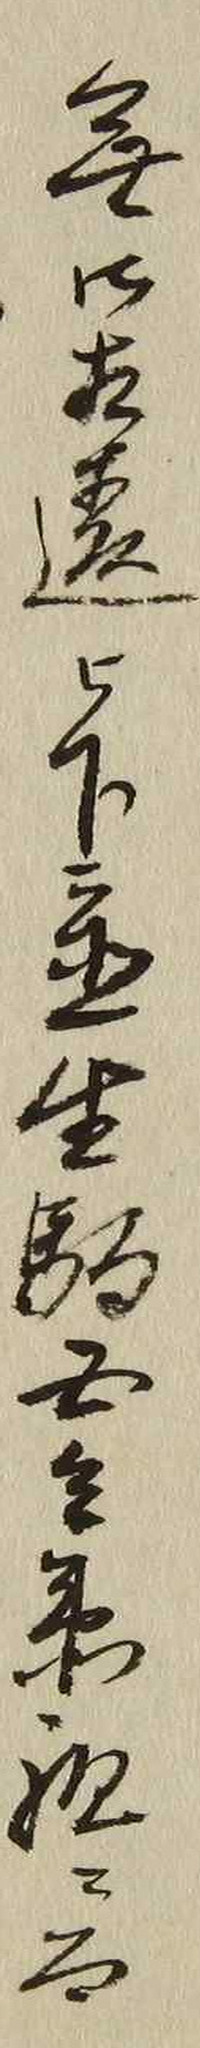無御相違被下置生駒五兵衛組ニ而
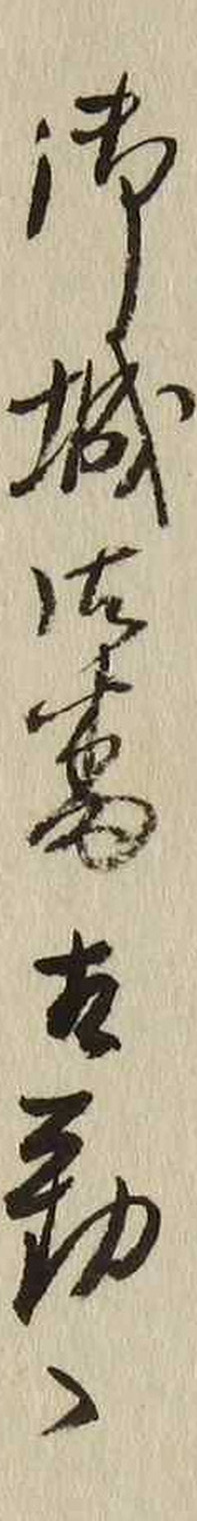御城御番相勤候
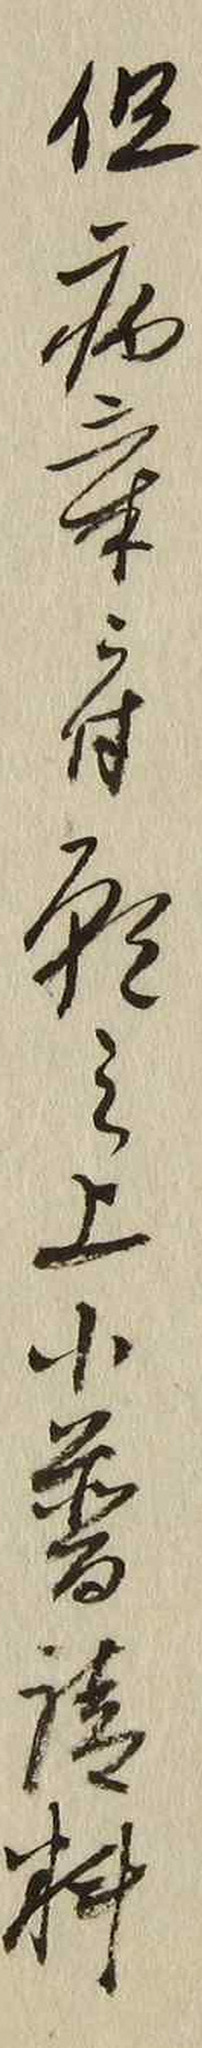但病気ニ付願之上小普請料
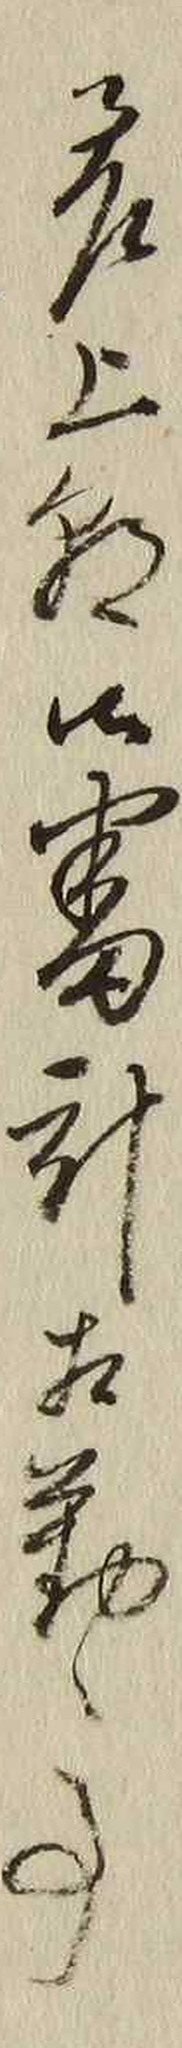差上朝御番計相勤候事
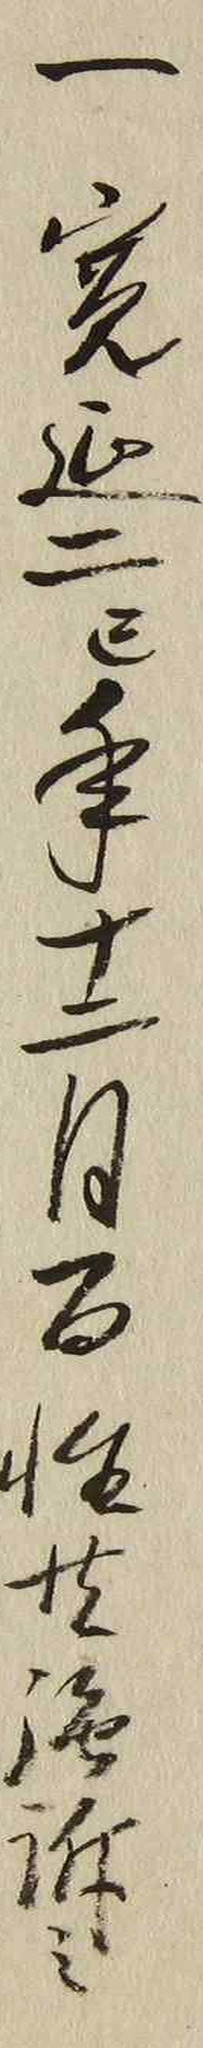一寛延二巳年十二月百性共強訴之
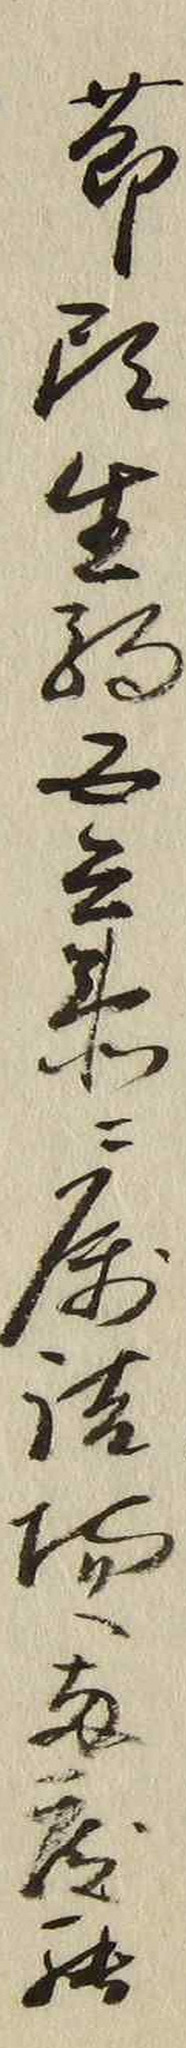節頭生駒五兵衛ニ属詰場へ両度罷
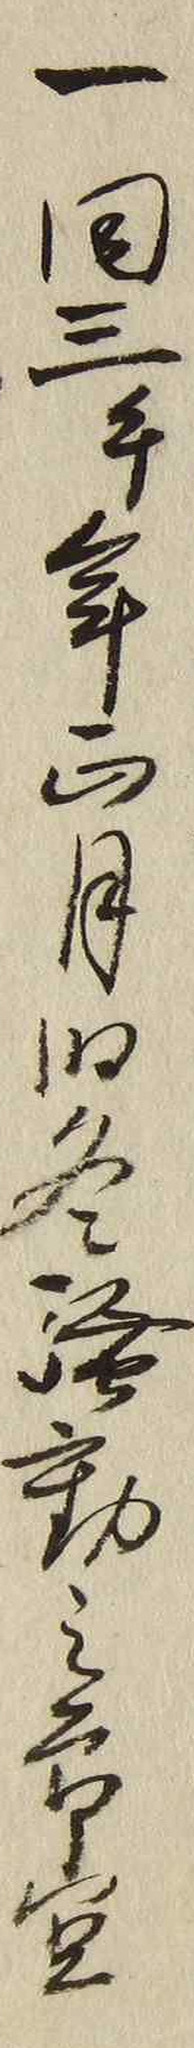一同三午年正月旧冬騒動之節宜
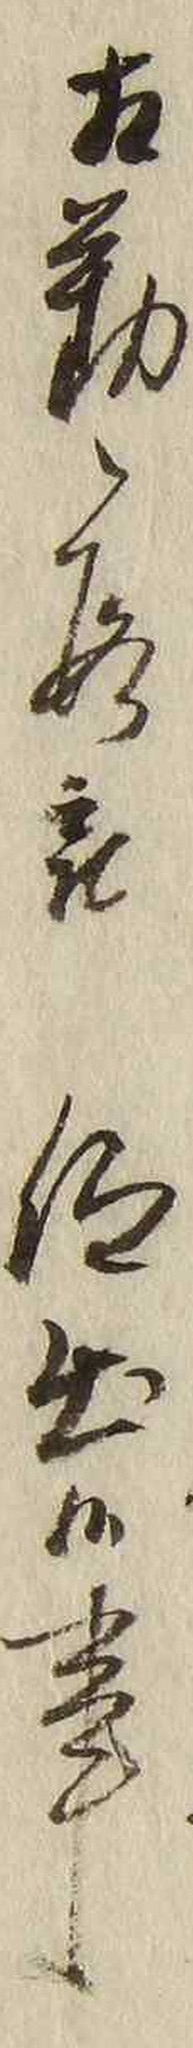相勤候段被仰出候事

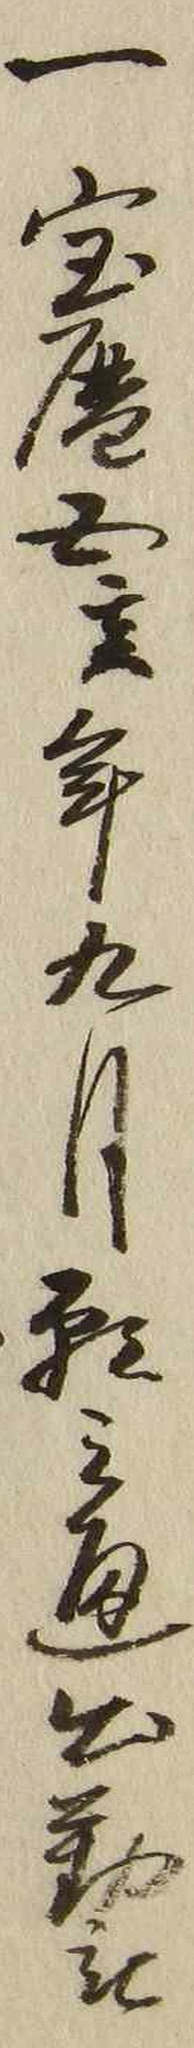一宝暦五亥年九月願之通出勤被
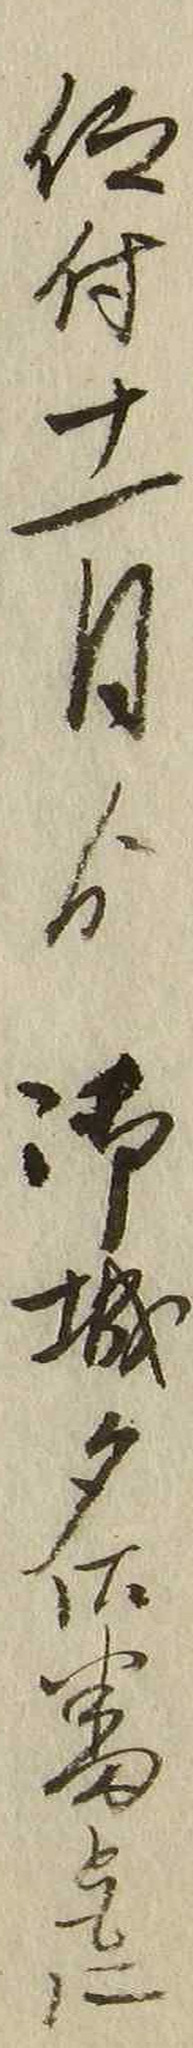仰付十一月ゟ御城夕御番ともに
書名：諸士系譜　巻之356　す之部6
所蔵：会津若松市立会津図書館
